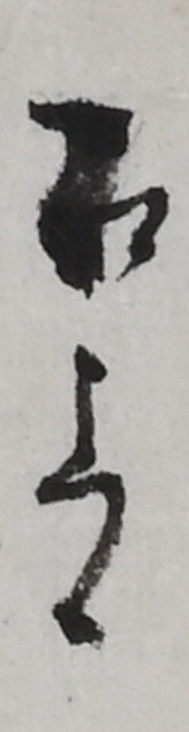召上候
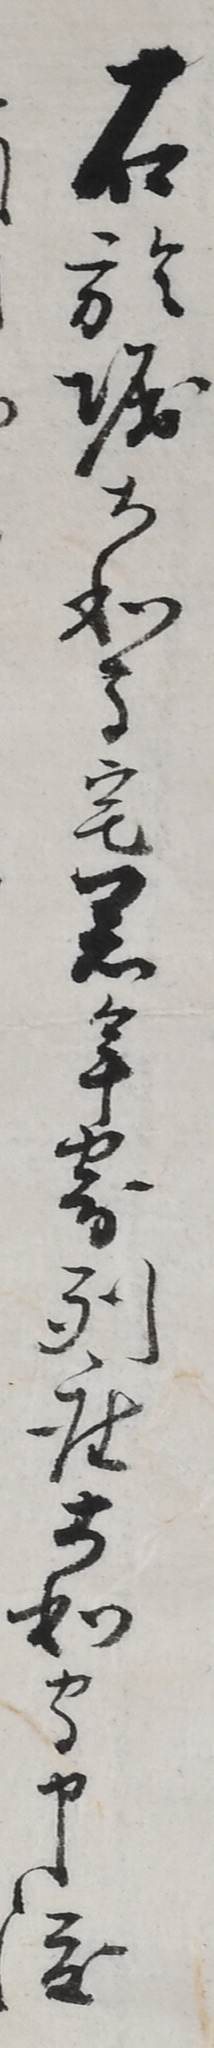右於堀大和守宅若年寄列座大和守申渡
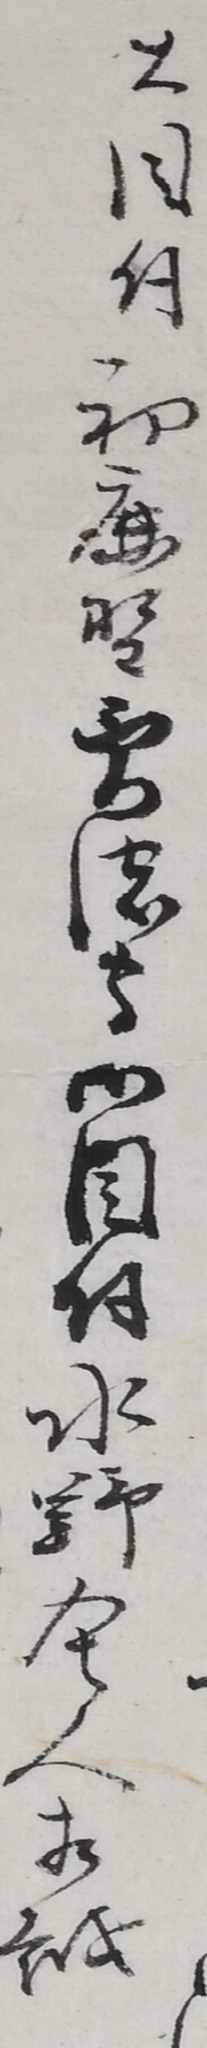大目付初鹿野美濃守御目付水野舎人相越
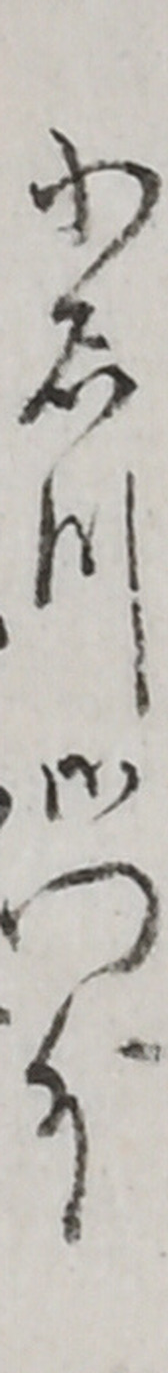小石川御門外
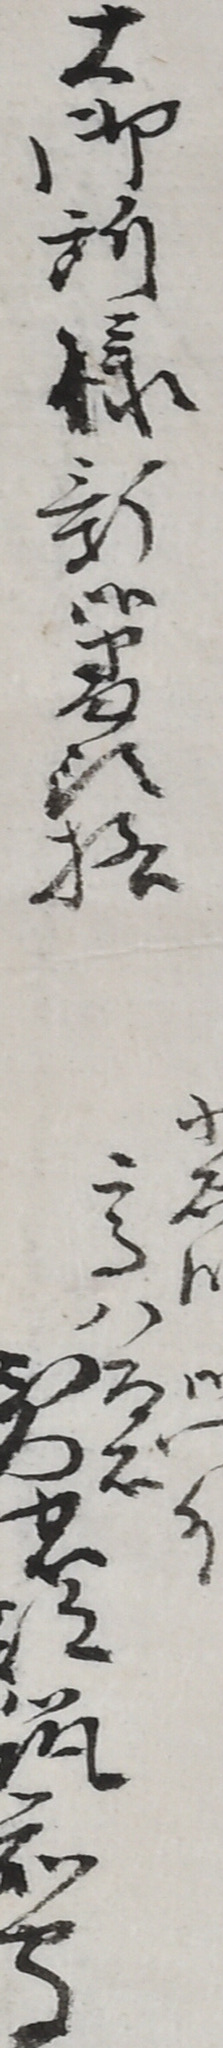大御所様新御番頭格高八百石
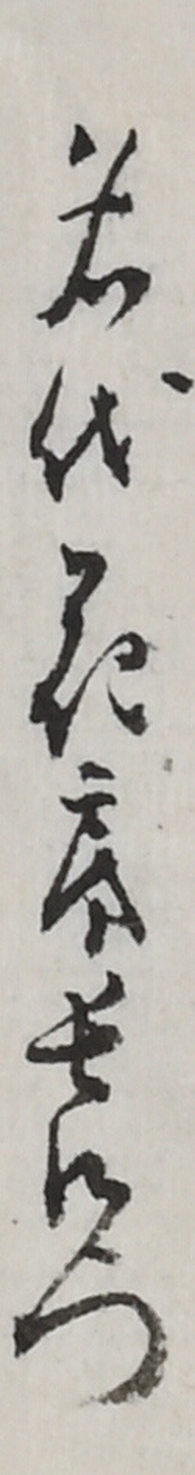名代花房長左衛門
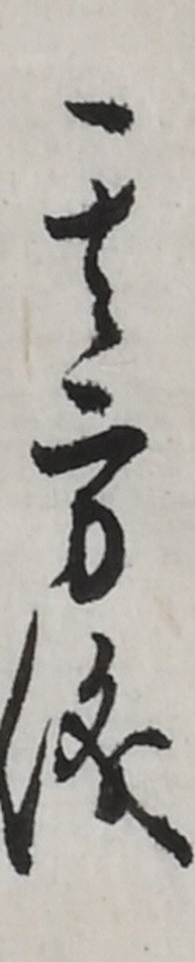其方儀
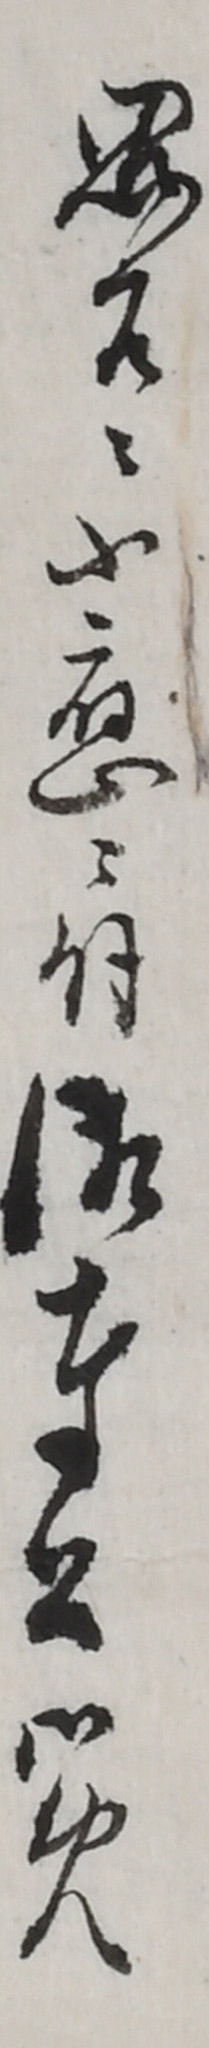思召ニ不応ニ付御奉公御免
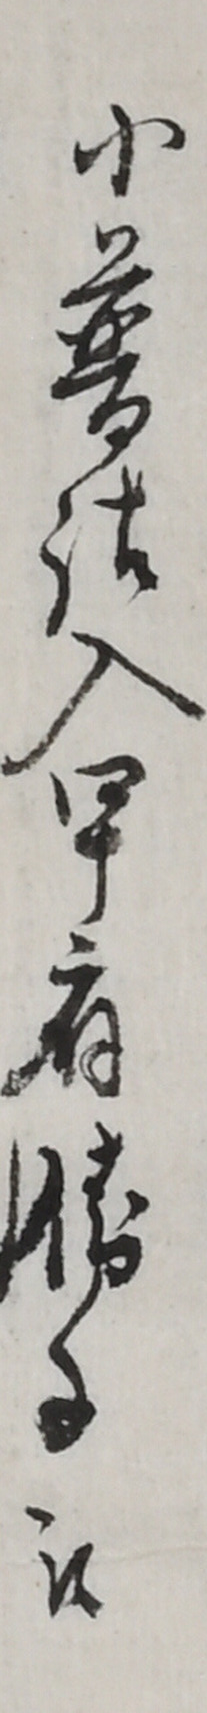小普請入甲府勝手被
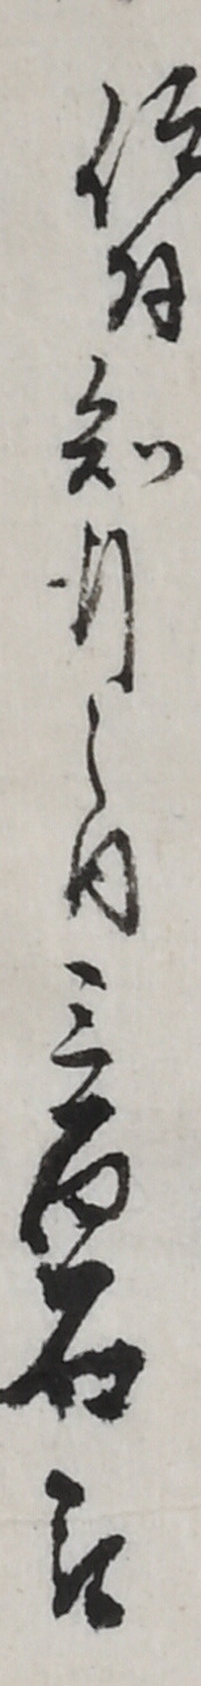仰付知行之内三百石被
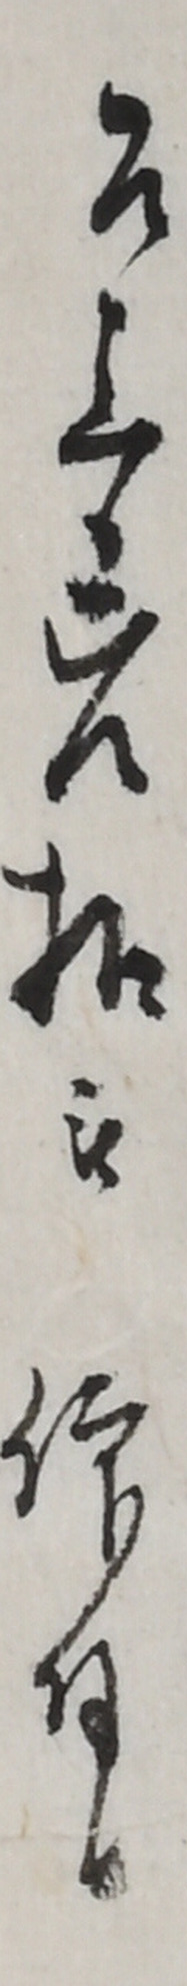召上差控仰付候
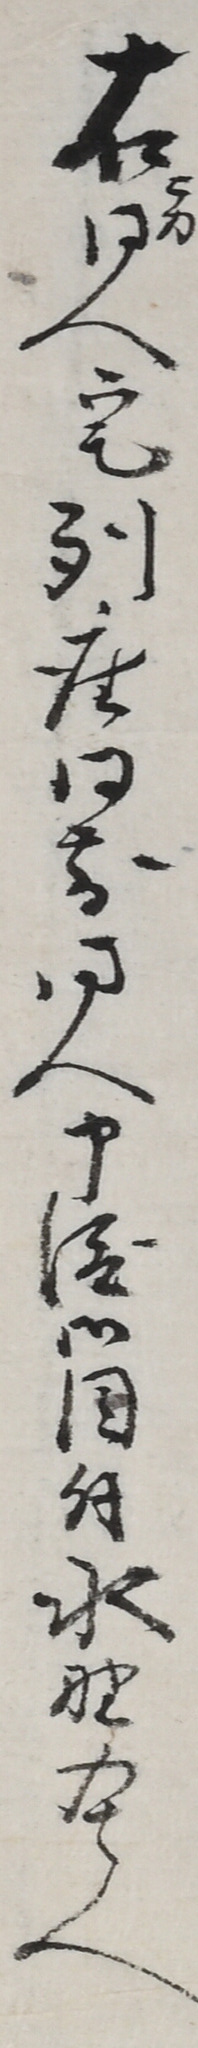右於同人宅列座同前同人申渡御目付水野舎人

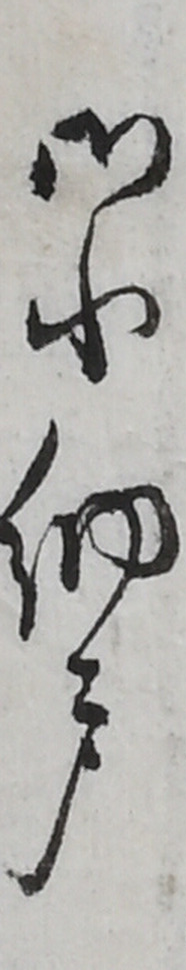御小納戸
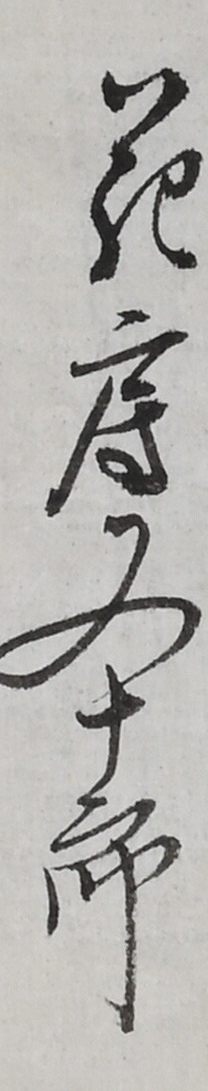花房又十郎
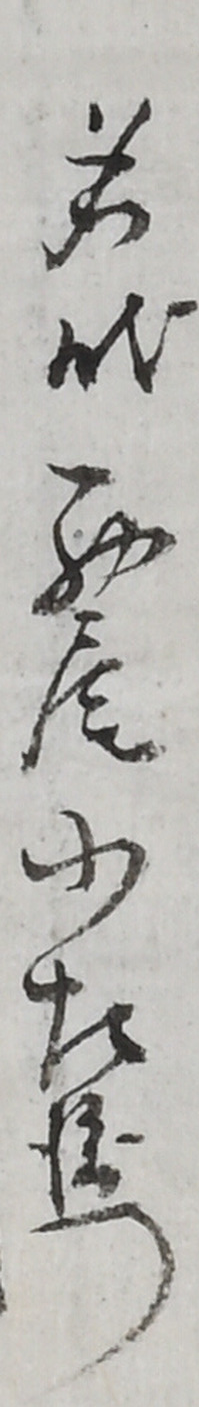名代西尾小左衛門
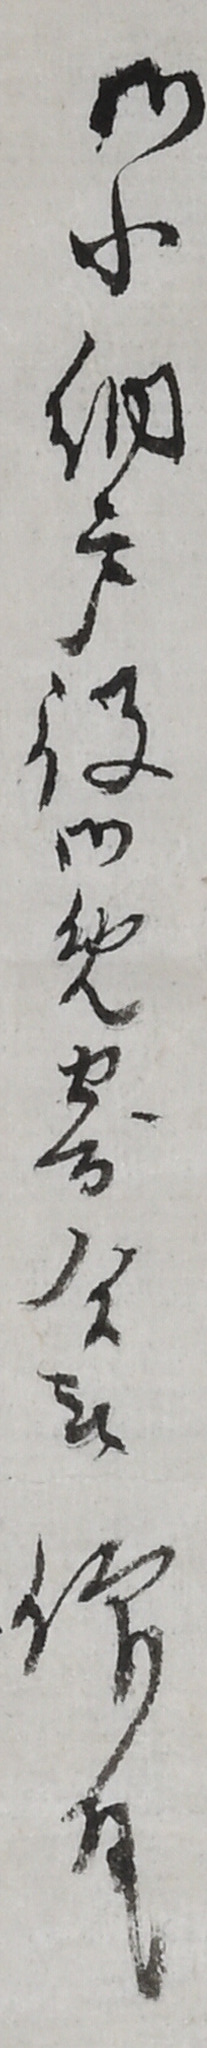御小納戸役御免寄合被仰付候
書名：申渡候書付
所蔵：伊那市立高遠町図書館・合同会社AMANE
